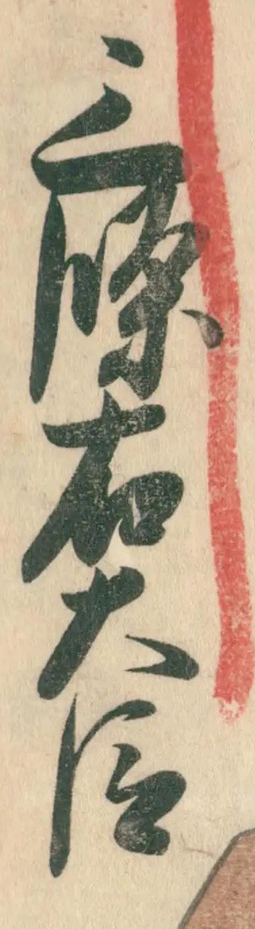三條右大臣

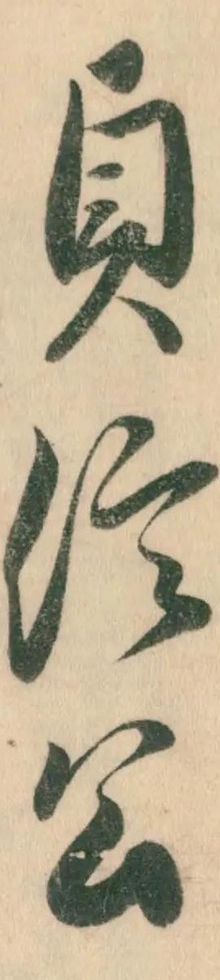貞信公

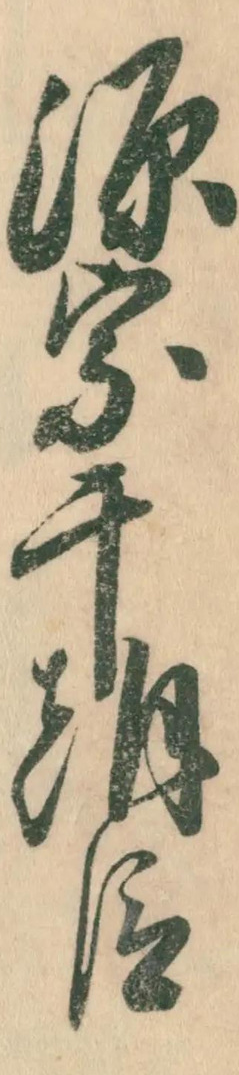源宗于朝臣
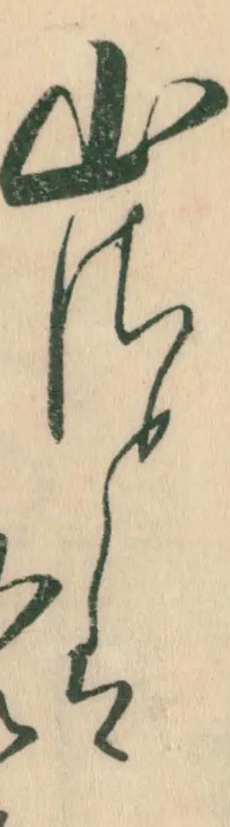山さとは
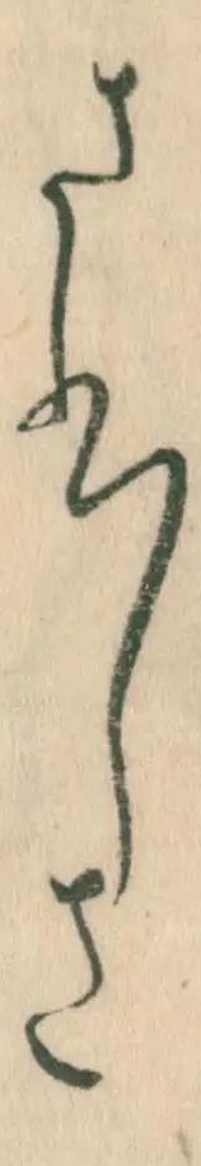さひしさ
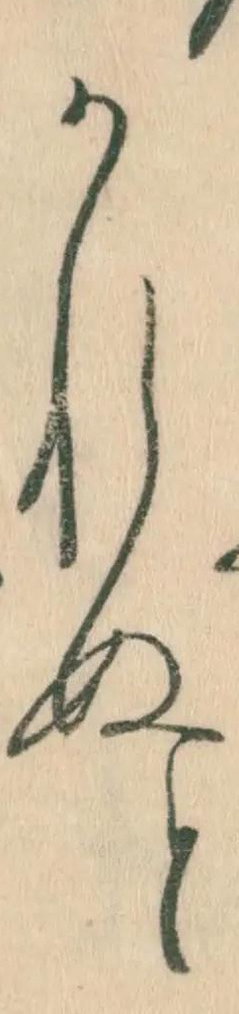かれぬと
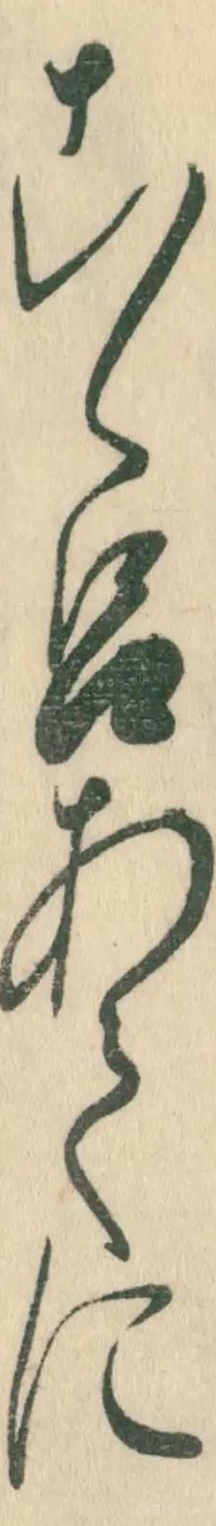こゝろあてに
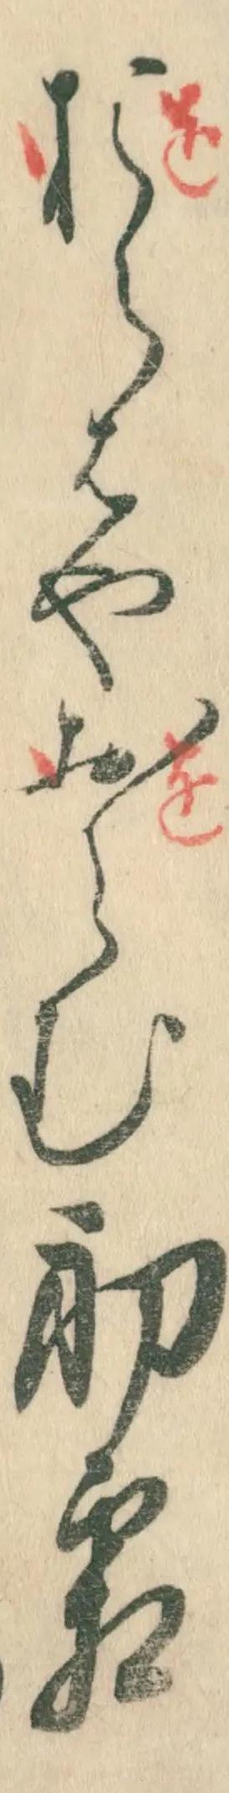おらはやおらむ初霜
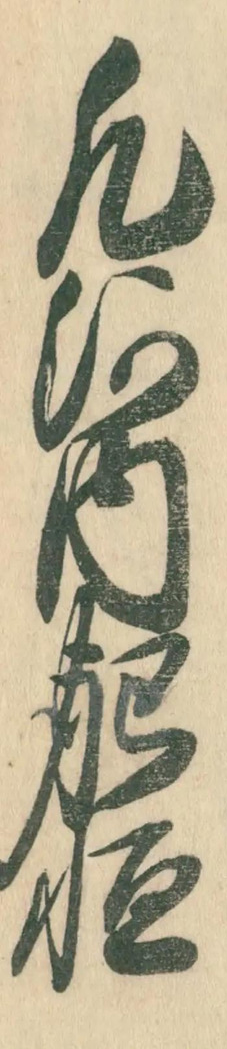凡河内躬恒

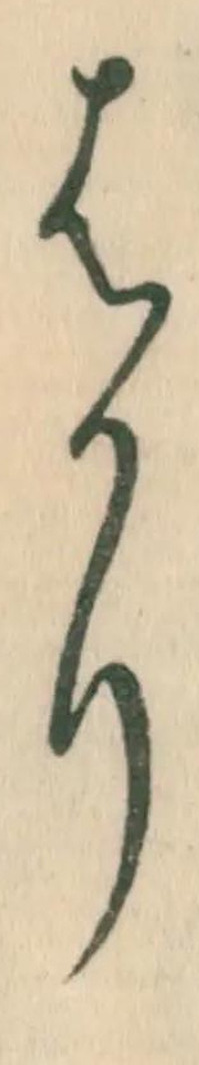はかり
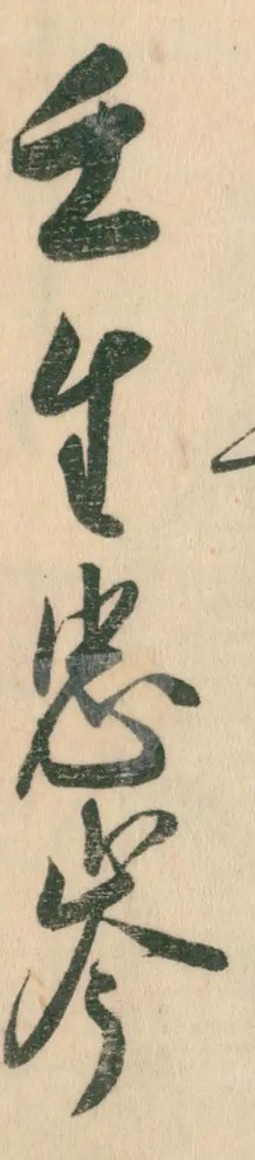壬生忠岑
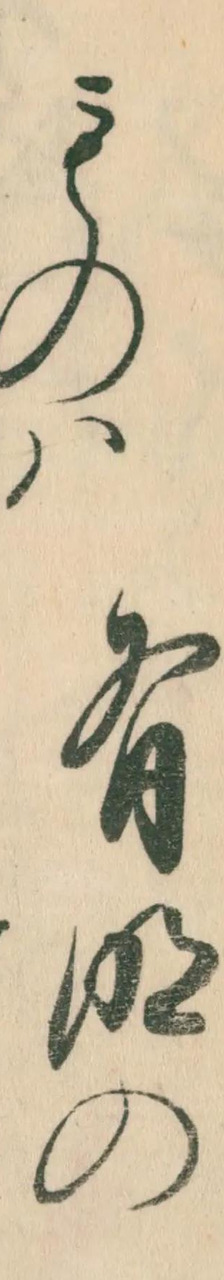ものは有明の
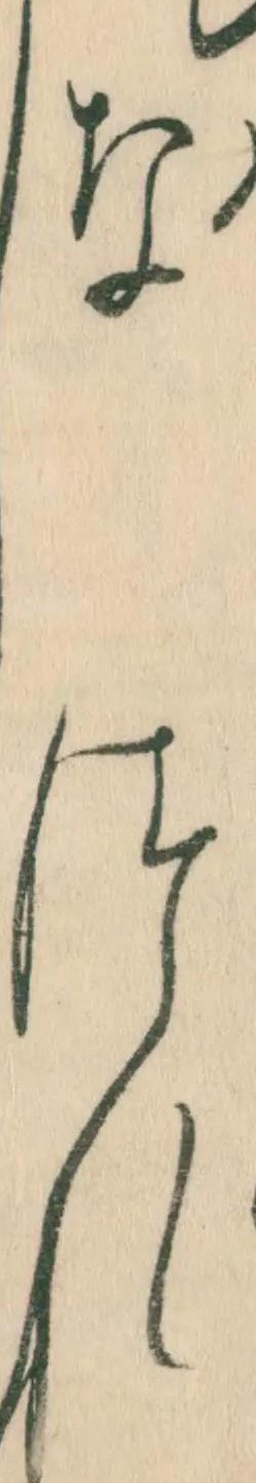なつれ
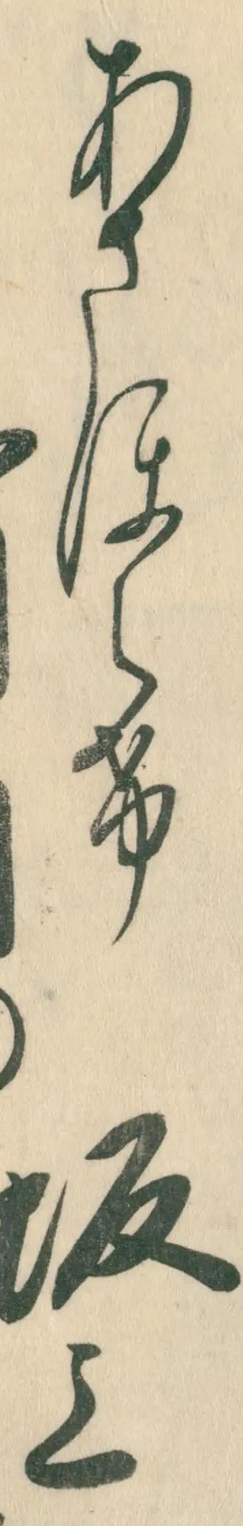あさほらけ坂上

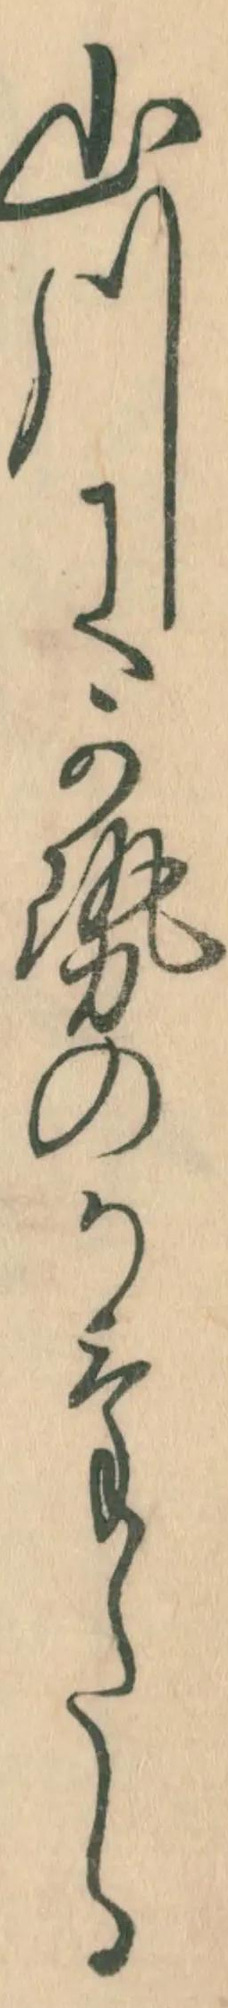山川にかせのかけたる
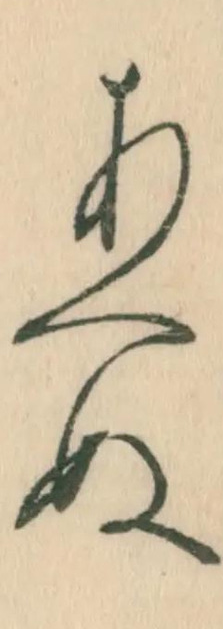あへぬ
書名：錦百人一首あつま織
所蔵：国立国会図書館 National Diet Library, JAPAN
